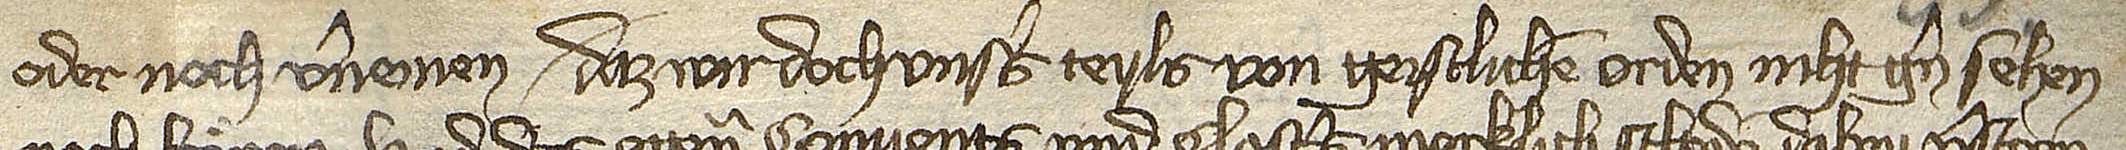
oder noch v*nemen / daʒ wir doch vnſ*s teyls von geiſtliche* orden niht g*n ſehen
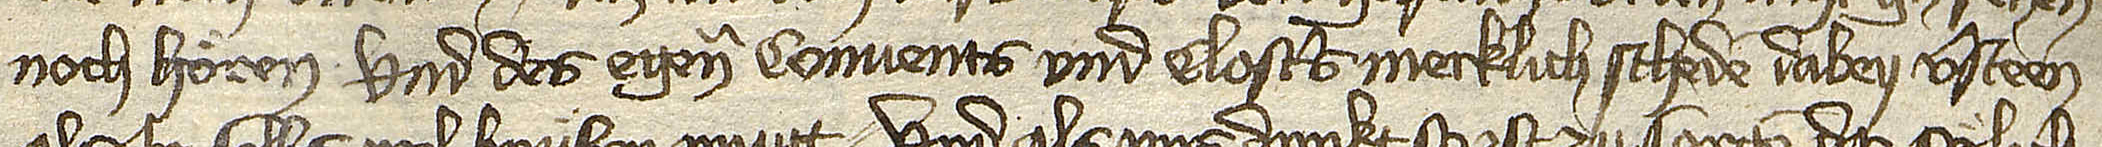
noch hören . Vnd des egen* Conuents vnd Cloſt*s merklich ſchede* dabey v*ſteen
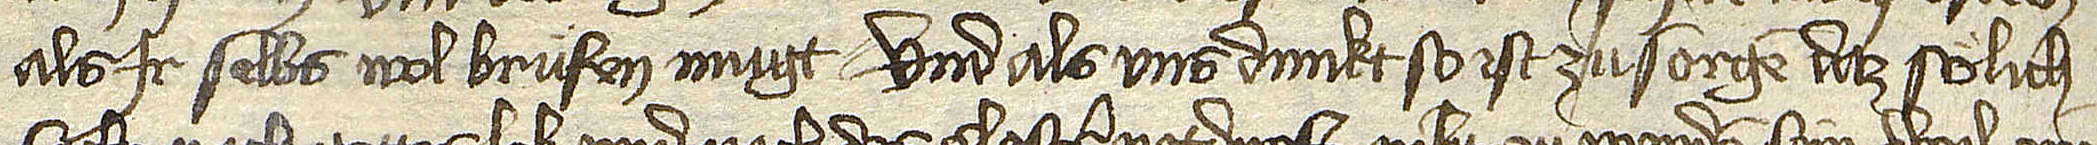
als Ir ſelbs wol brüfen mugt / Vnd als vns dunkt ſo iſt ʒu ſorge* daʒ ſölich
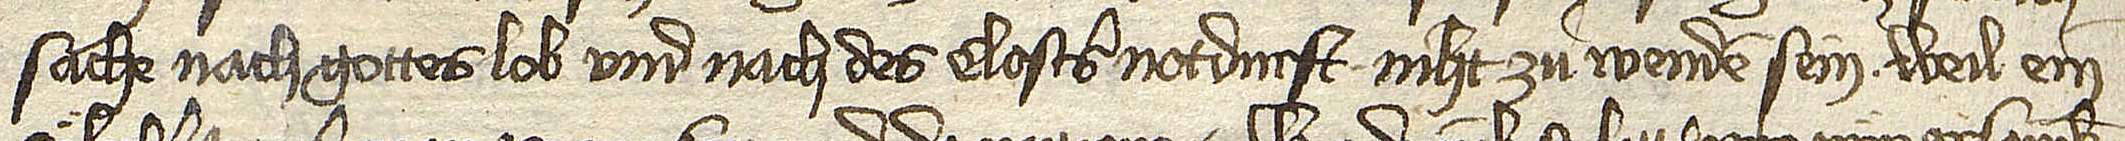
ſache nach gottes lob vnd nach des Cloſt*s notdurft . niht ʒu wende* ſein . weil ein
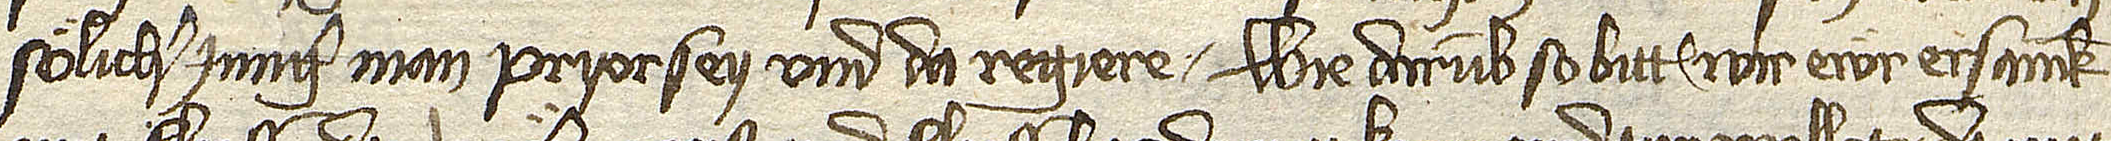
ſölich* Iung* man Pryor ſey vnd da regiere / Wie darub* ſo bitt* wir eẅr erſamk*
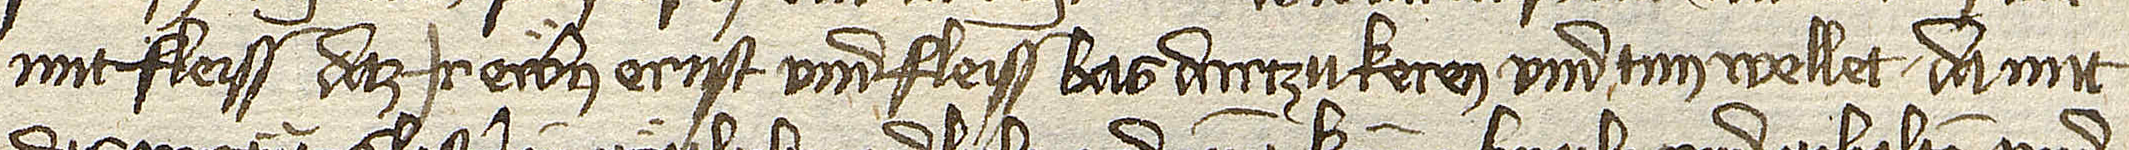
mit fleiſſ Daʒ Ir eẅ*n ernſt vnd fleiſſ bas darcʒu keren vnd tun wellet / Da mit
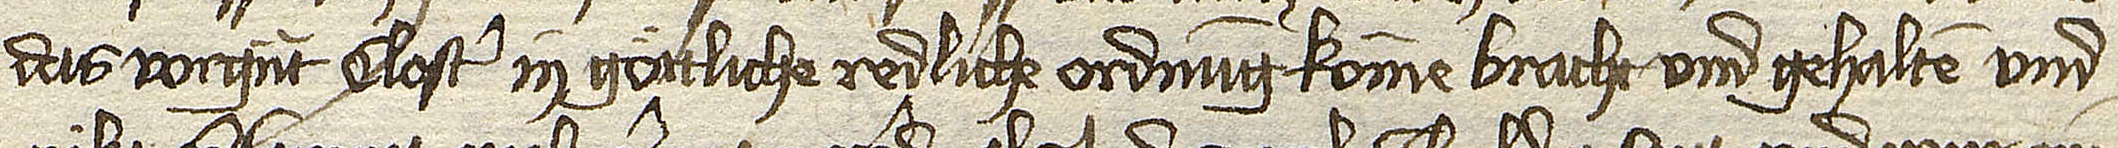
das vorgnt* Cloſt* in göttliche redliche ordnu*g kome* bracht vnd gehalte* vnd
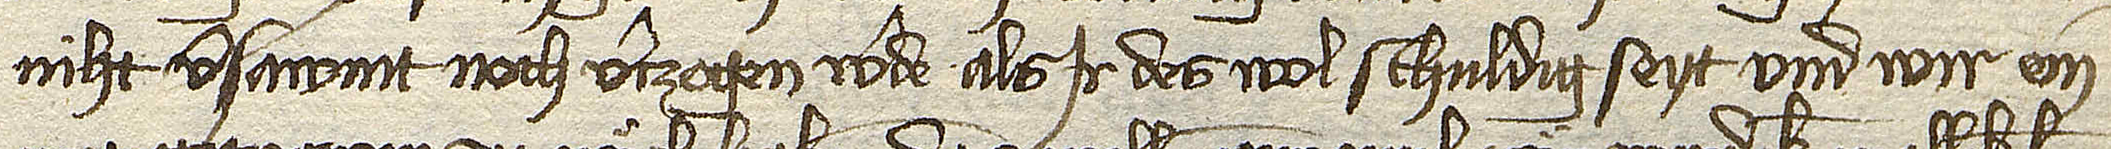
niht v*ſawmt noch v*cʒogen w*de . als Ir des wol ſchuldig ſeyt vnd wir ein
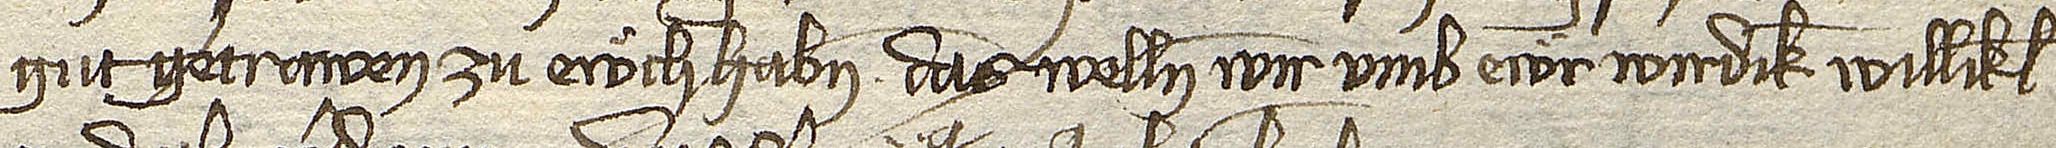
gut getrawen ʒu eẅch habn* . das welln* wir vmb eẅr wirdik* willikl*
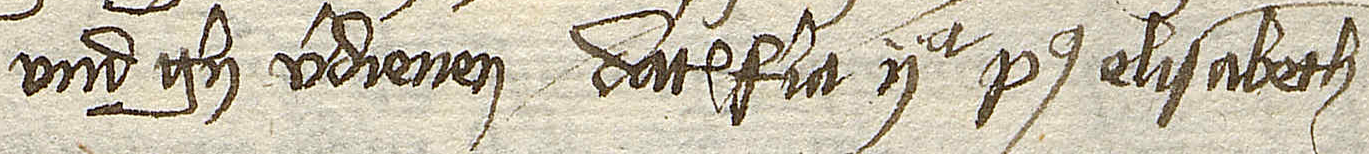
vnd g*n v*dienen / Dat* fi*a ii* p* eliſabeth
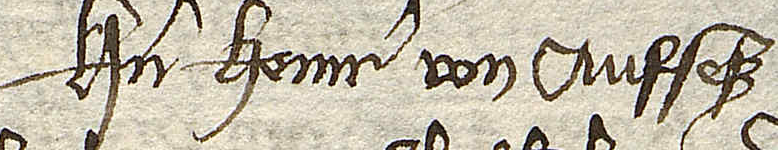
Hn* Heinr* von Aufſeſʒ
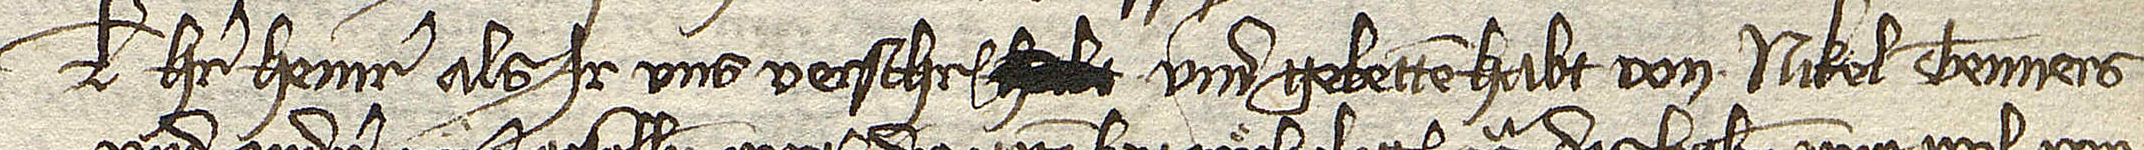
L* hr* heinr* als Ir vns verſchr* habt vnd gebette* habt von . Nikel Tenners
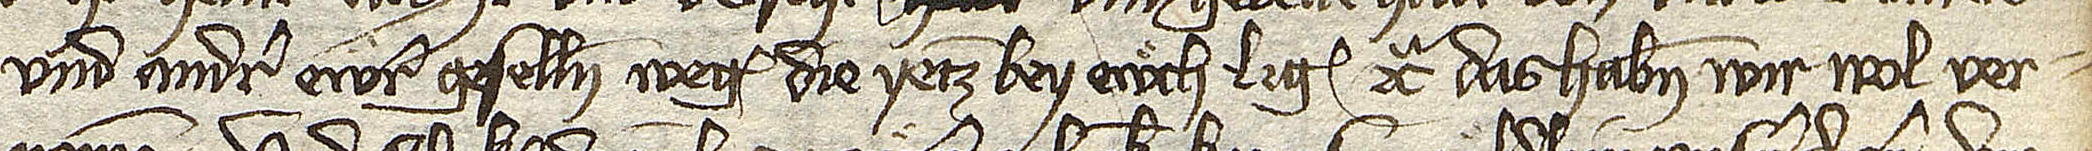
vnd andr* eẅr* geſelln* weg* die yecʒ* bey eẅch lig* ec* das habn* wir wol ver =
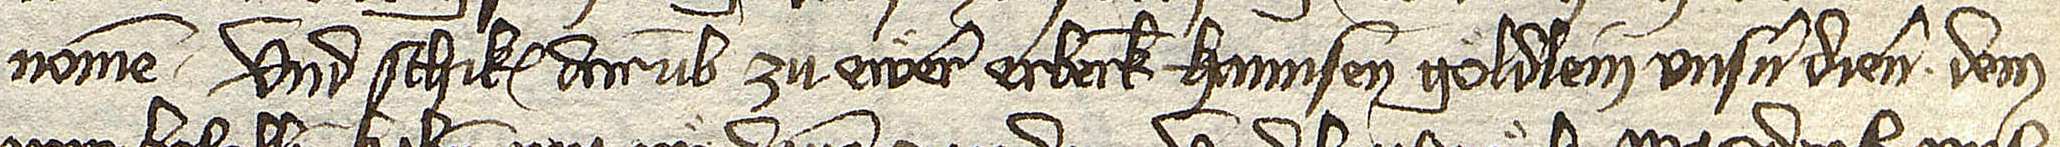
nome* / Vnd ſchik* darub* ʒu eẅer* erberk* hannſen göldlein vnſn* dien* . dem
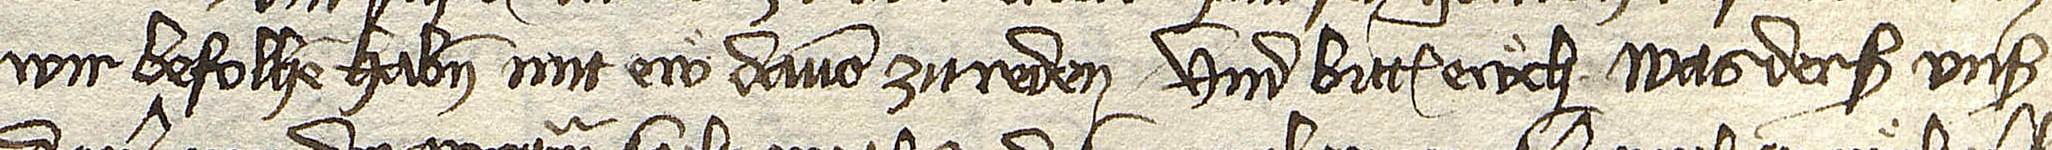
wir befolhe* habn* mit eẅ dauo* ʒureden / Vnd bitt* eẅch was derſ* vnſ*
